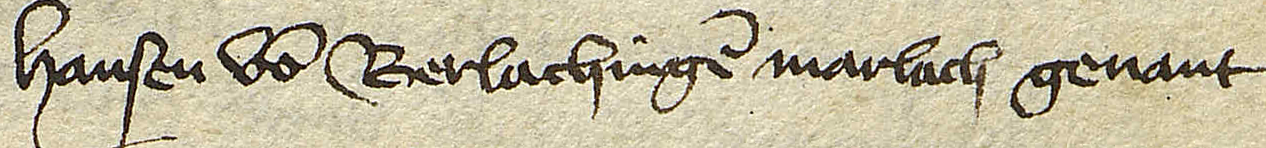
hanſen vo* Berlachinge* marlach genant
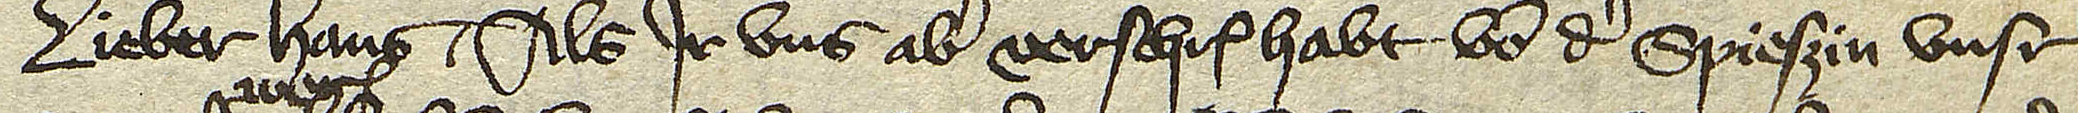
Lieber hans / Als Ir vns ab* verſchr* habt vo* d* Spieſʒin vnſr*
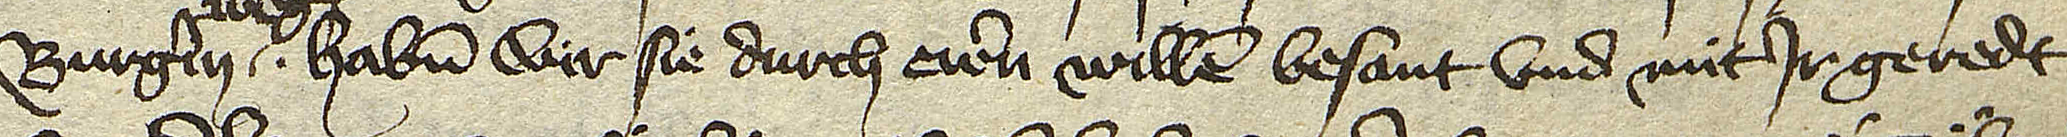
Burg*in / . habn* wir ſie durch ew*n wille* beſant vnd mit Ir geredt
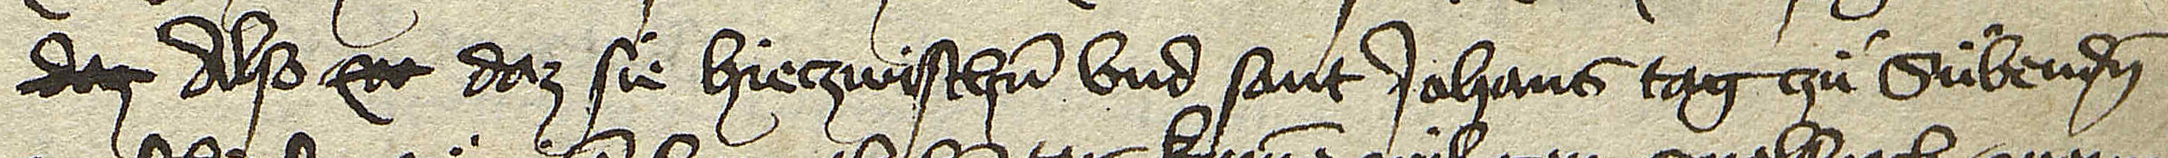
daʒ Alſo / w daʒ ſie hiecʒwiſchn* vnd ſant Iohans tag cʒü Sübendn*
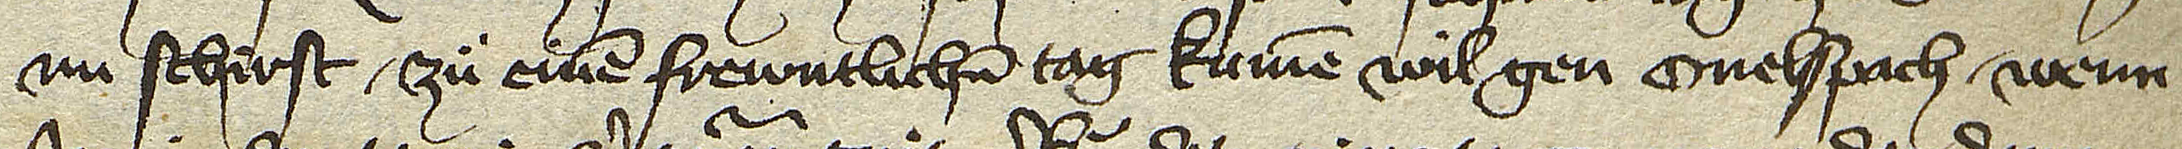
nu ſchirſt cʒü eine* frewntlichn* tag kume* wil gen Onelſpach / wenn
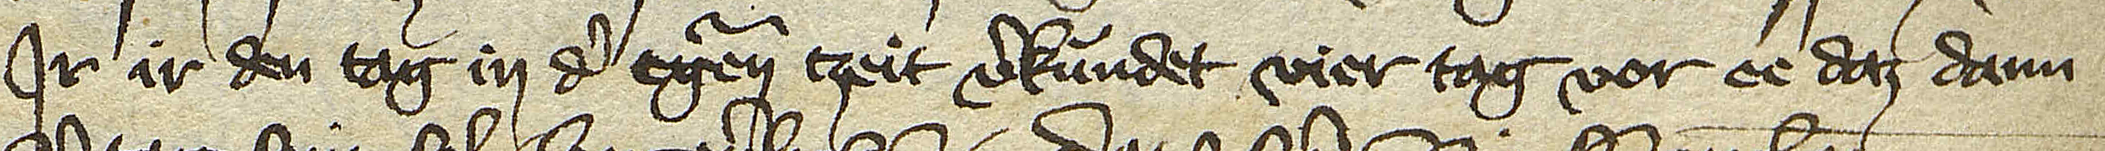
Ir ir den tag in d* egen* cʒeit v*kündet vier tag vor ee daʒ dann
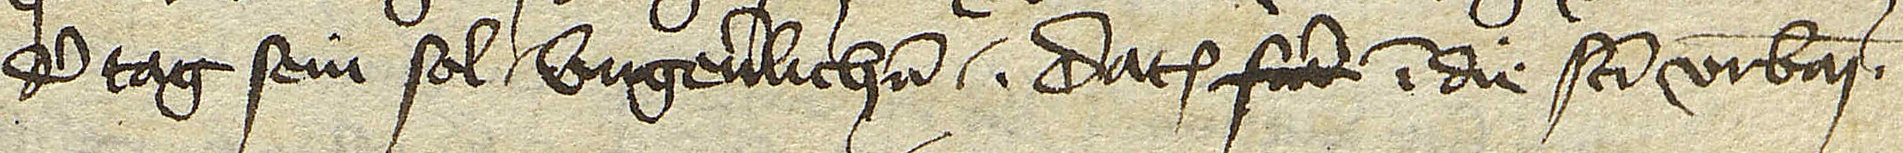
d* tag ſein ſol / vngeu*lichn* / . Dat* fia* i* die ſci* vrbai* .
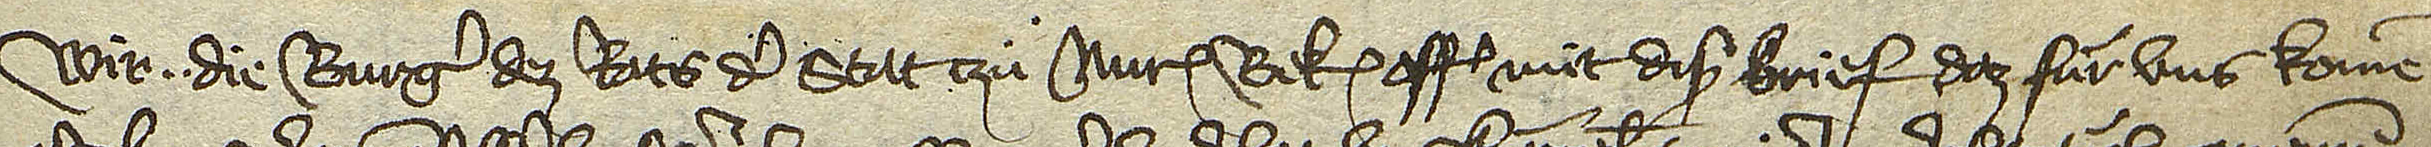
Wir die Burg* deʒ Rats d* Stat cʒü Nur* Bek* off* mit diſ* brief daʒ für vns kome*
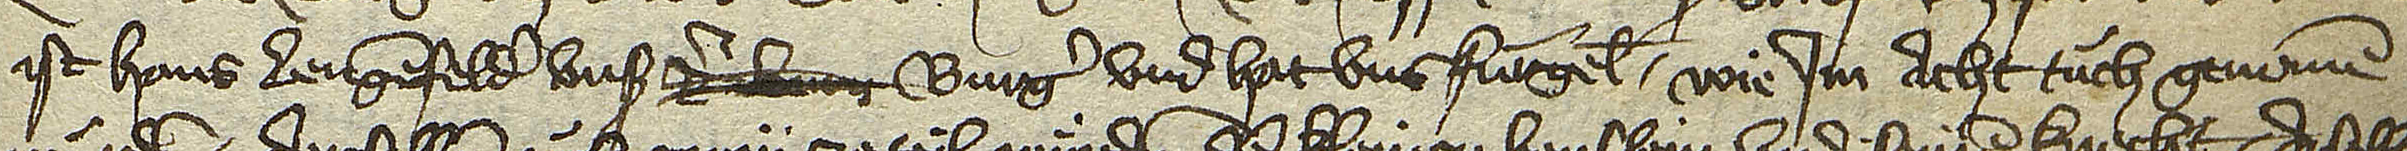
iſt hans Lenge*feld* vnſ* B* burg Burg* vnd hat vns fürgel* / wie Im Acht tüch genome*
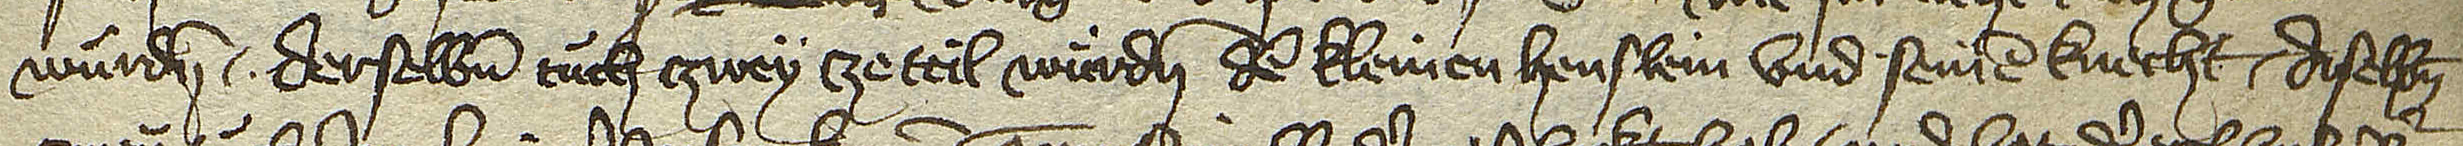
würdn* / . Derſelbn* tüch cʒwey cʒe teil würdn* d* kleinen henſlein vnd ſeine* knecht / diſelbn*
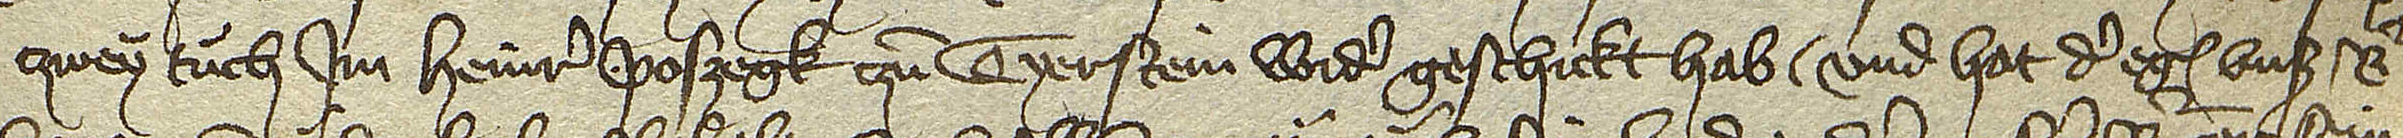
cʒwey tüch Im heinr* Poſʒegk* cʒü Tyerſtein wid* geſchickt hab / vnd hat d* eg* vnſ* B*
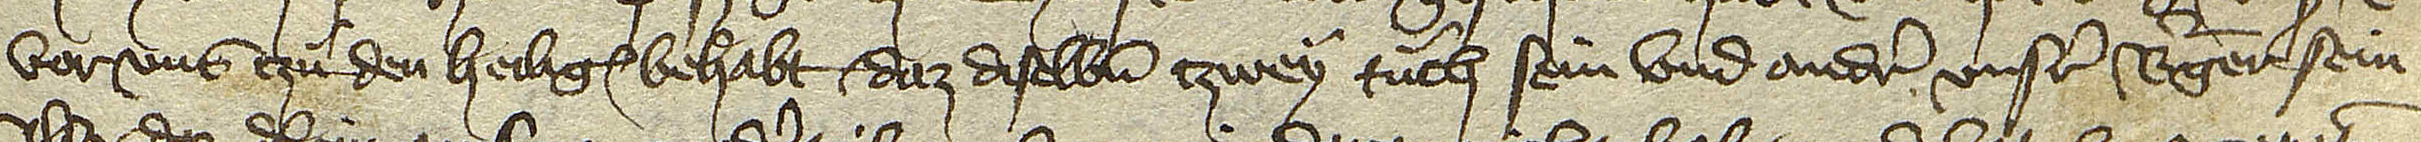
vor vns cʒu den heilig* behabt / daʒ diſelbn* cʒwey tüch ſein vnd andr* vnſr* B*ger ſein
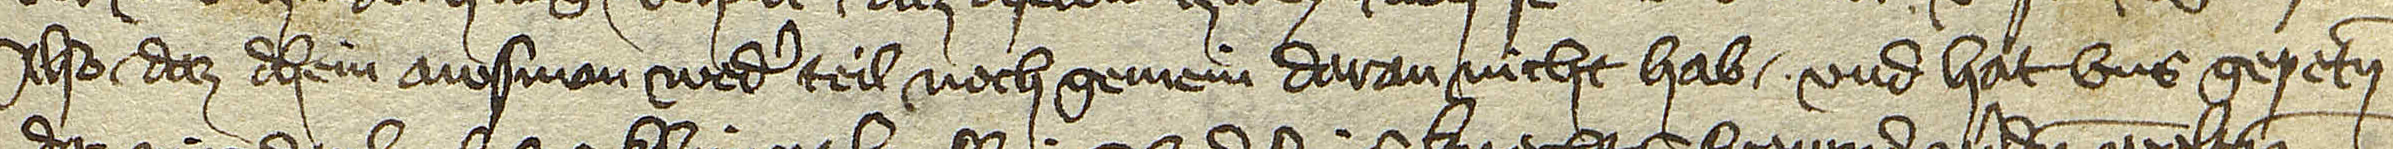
Alſo / daʒ dhein awſman wed* teil noch gemein daran nicht hab / . vnd hat vns gepetn*
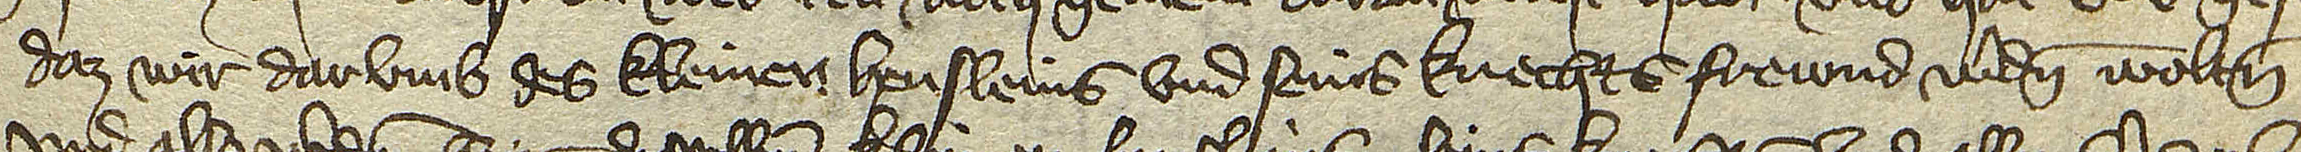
daʒ wir darvmb des kleinen henſleins vnd ſeins knechts frewnd w*dn* woltn*
